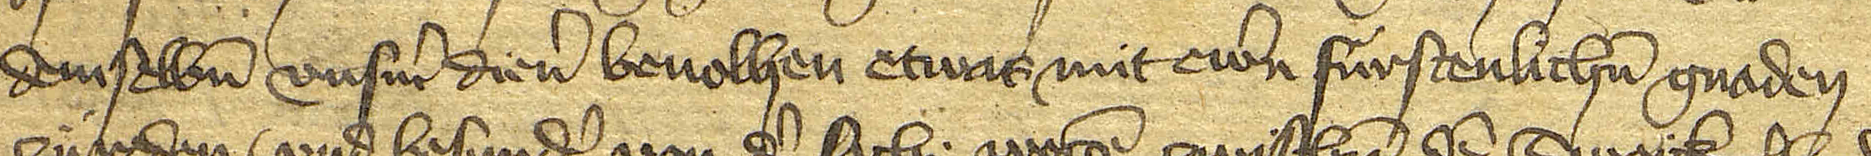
demſelbn* vnſm* dien* beuolhen etwas mit ew*n fürſtenlichn* gnaden
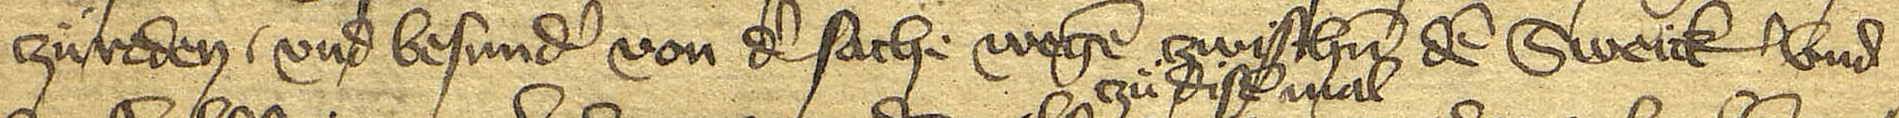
cʒüreden / vnd beſund* von d* ſache wege* cʒwiſchn* d* Sweick* vnd
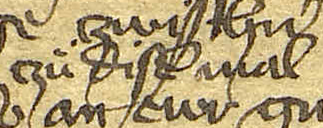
cʒü diſe* mal
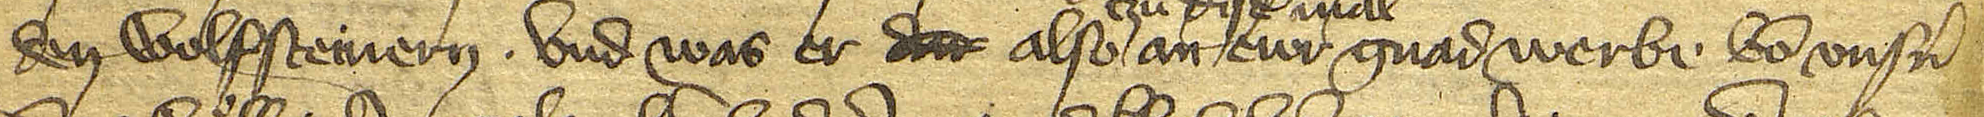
den Wolfſteinern . vnd was er dar alſo an ewr gnad werbe vo* vnſn*
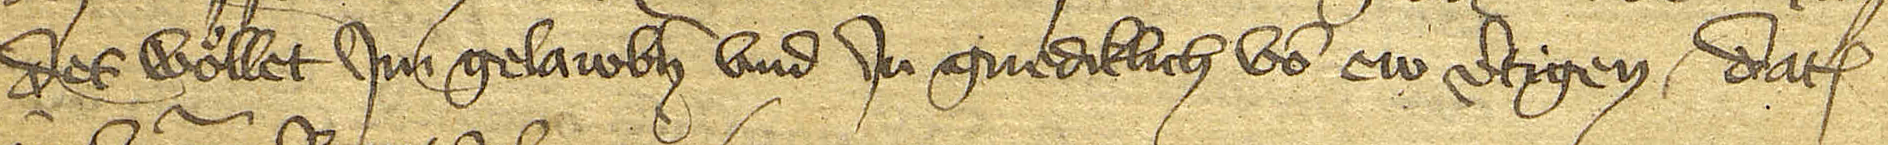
Des wöllet Im gelawbn* vnd In gnediklich vo* ew v*tigen / Dat*
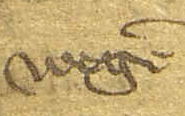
wege*
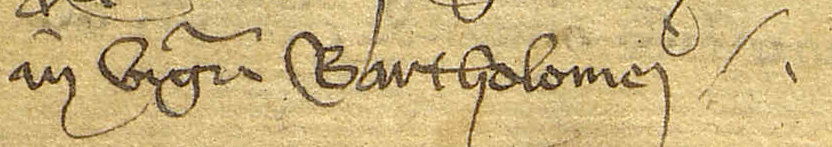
in vigi* Bartholomei / .
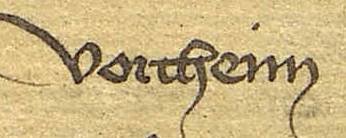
Vorcheim
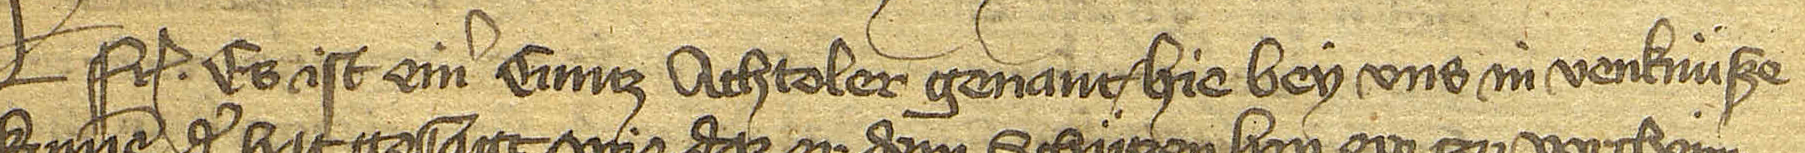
L* fr* . Es iſt ein* Cuntʒ Achtoler genant / hie bey vns in venknüſʒe
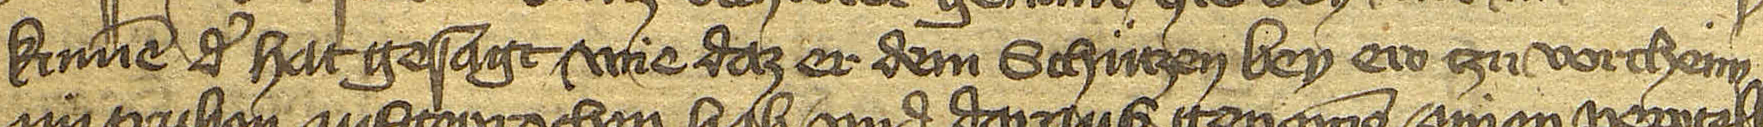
kume* d* hat geſagt / wie daʒ er dem Schücʒen bey ew cʒu vorcheim
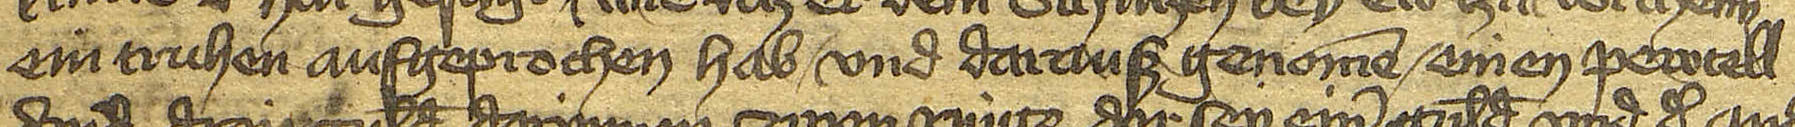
ein truhen aufgeprochen hab / vnd darauſʒ genome* / einen pewtell
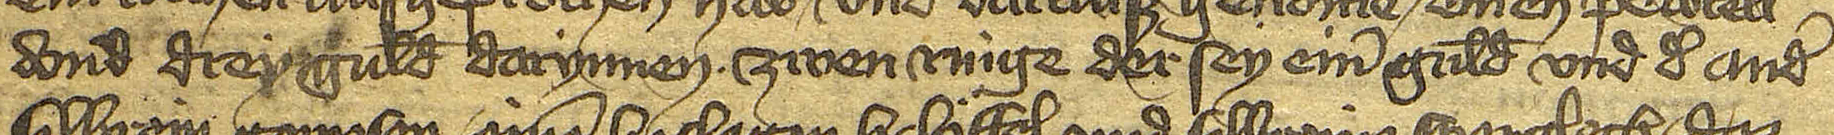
vnd drey guld* darynnen . cʒwen ringe der ſey ein* guld* vnd d* and*
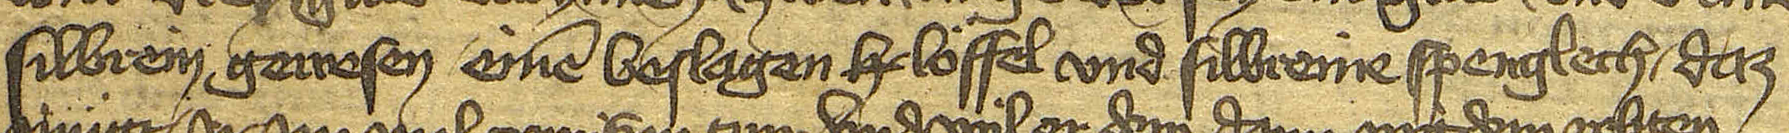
ſilbrein geweſen / eine* beſlagen h löffel vnd ſilbreine ſpenglech / daʒ
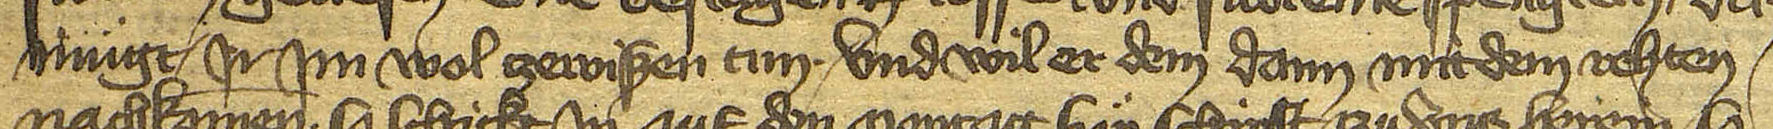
mügt Ir Im wol cʒewiſʒen tun . / vnd wil er dem dann mit dem rehten
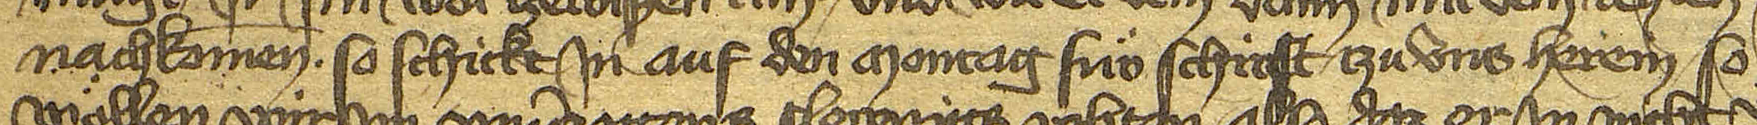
nachkom*en . ſo ſchickt In auf den Montag frw ſchirſt / cʒu vns herein / ſo
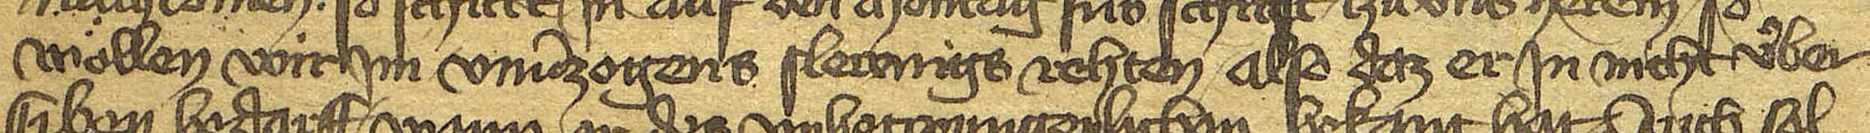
wöllen wir Im vnu*ʒogens ſlewnigs rehten / alſo daʒ er In nicht v̈ber
